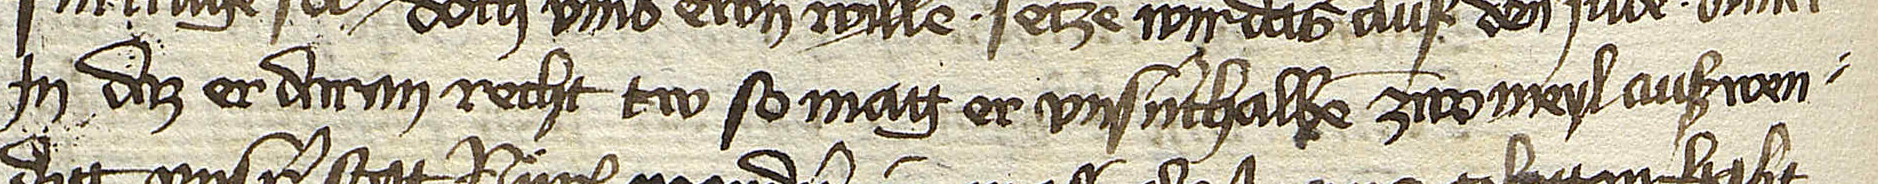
In daʒ er daran recht tw ſo mag er vnſ*nthalbe* ʒwo meyl auſʒwen =
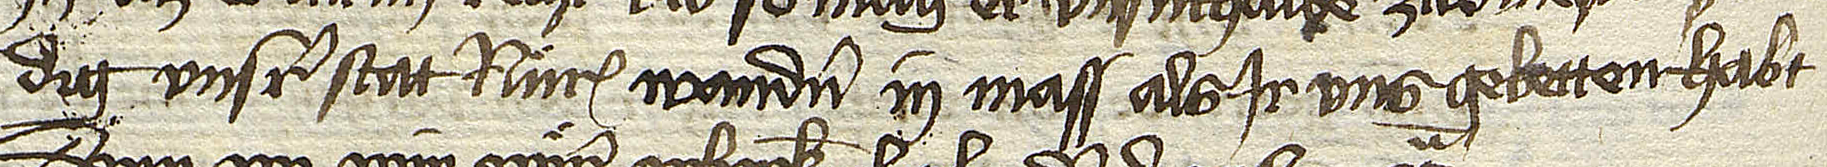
dig vnſ*r ſtat Nür* wand*n in maſſ als Ir vns gebetten habt
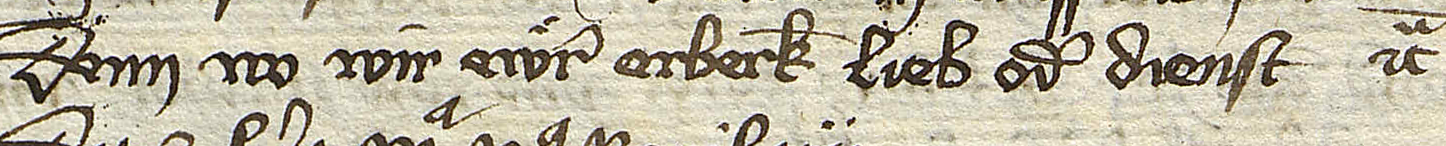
Denn wo wir ew*r erberk* lieb od* dienſt ec*
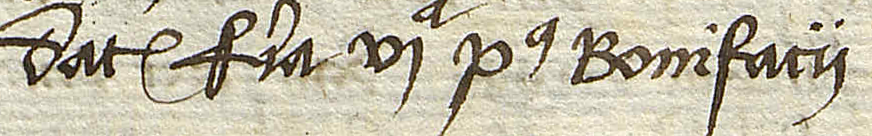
Dat* fia* vi* p* Bonifacii
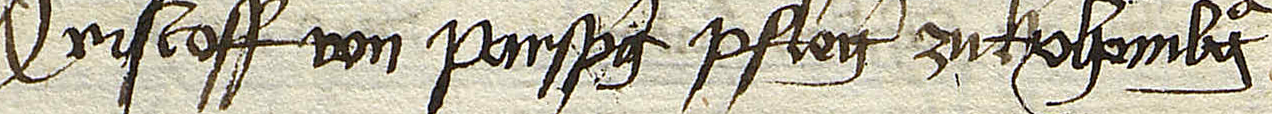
Criſtoff von Parſpg* pfleg* ʒu Hohemb*g
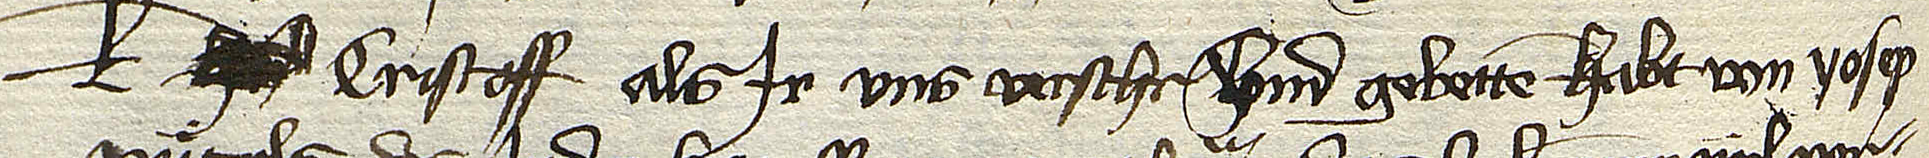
L* Hr* Criſtoff als Ir vns verſchr* vnd gebette* habt von yoſep
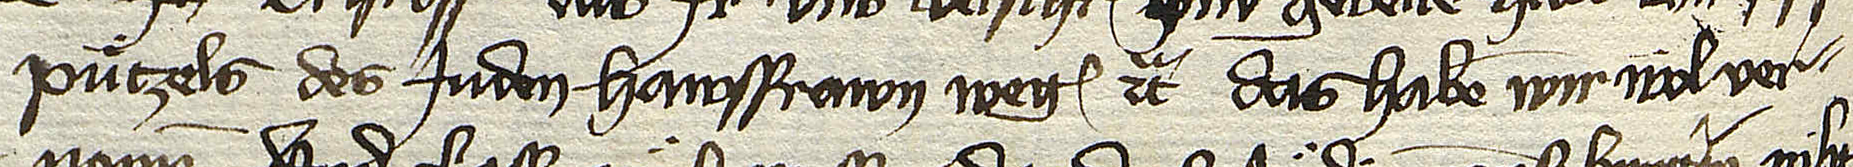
pücʒels des Iuden hawſfrawn weg* ec* das habe* wir wol ver =
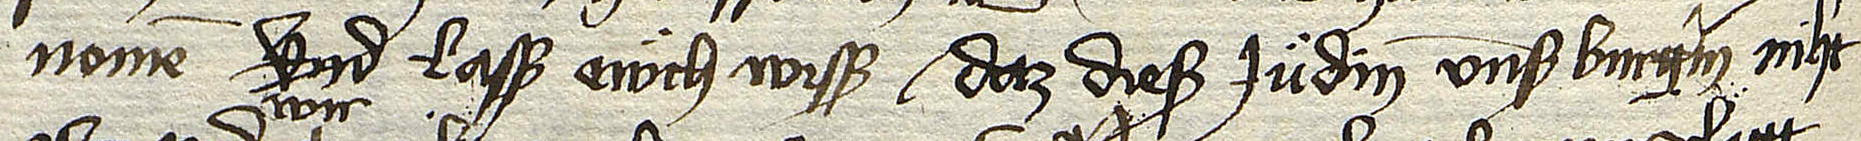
nome* Vnd laſſ* ewch wiſſ* / daʒ dieſ* Iüdin vnſ* burg*in niht
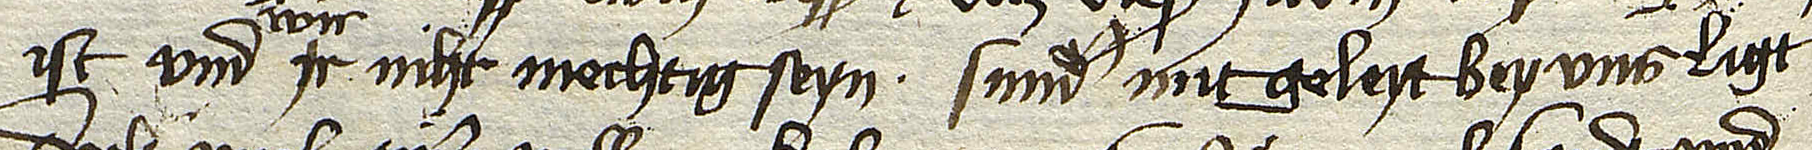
iſt vnd Ir niht mechtig ſeyn . ſund* mit geleyt bey vns ligt
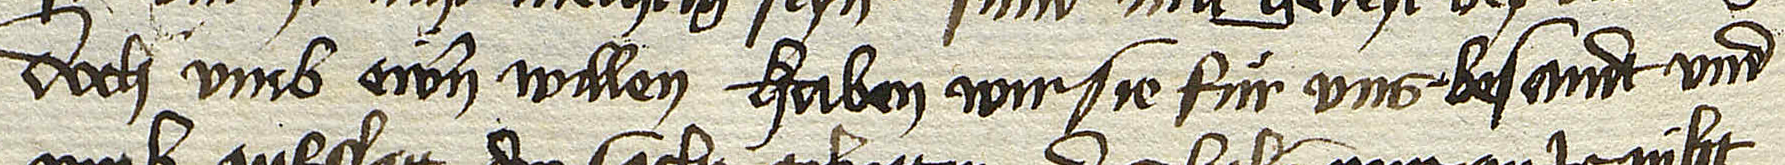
Doch vmb ew*n willen haben wir ſie für vns beſandt vnd
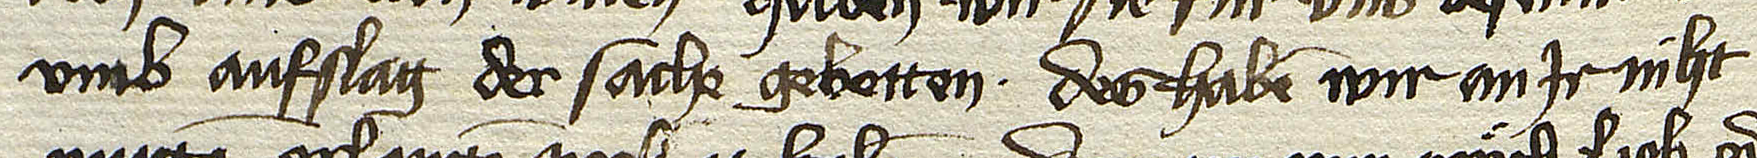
vmb aufſlag* der ſache gebetten . des habe* wir an Ir niht
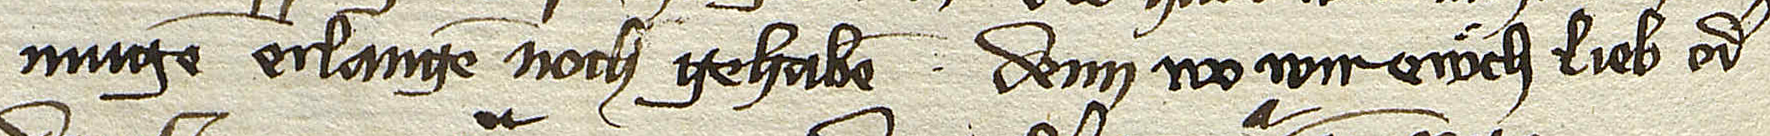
muge* erlange* noch gehabe* . Denn wo wir ewch lieb od*
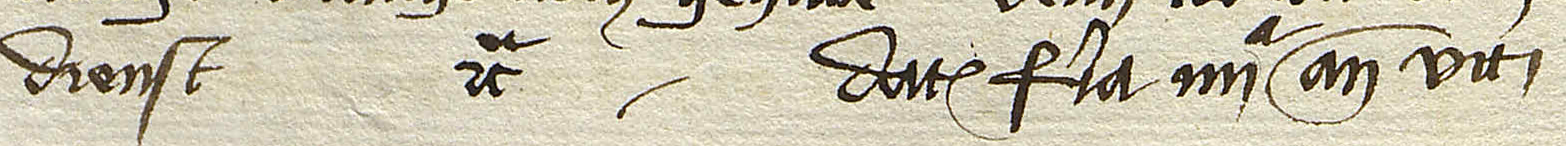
dienſt ec* / Dat* fia* iiii* an* viti
